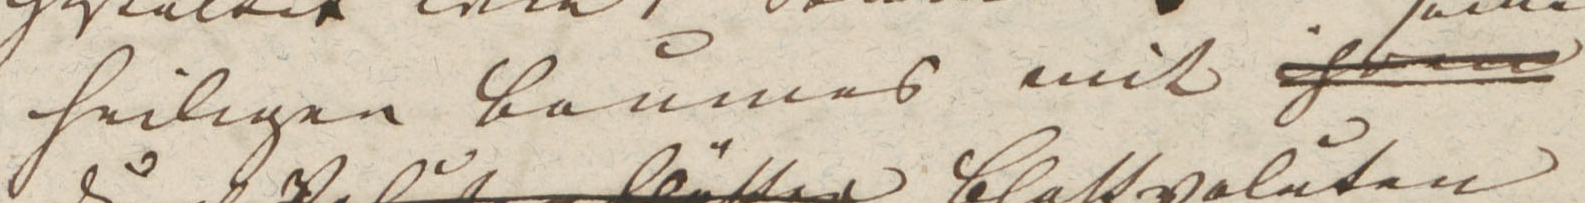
heiligen Baumes mit ihren seinen
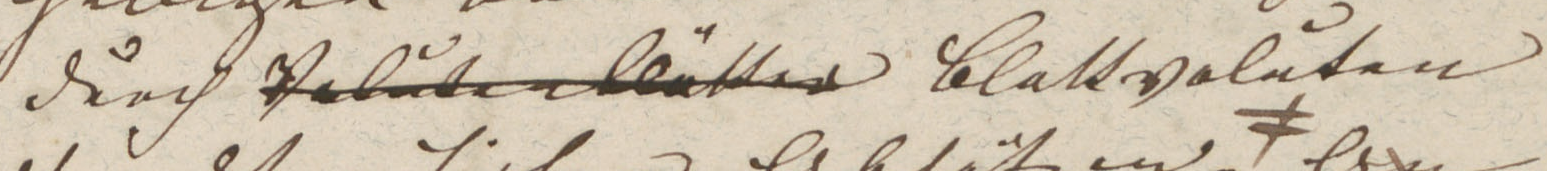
durch Volutenblätter Blattvoluten
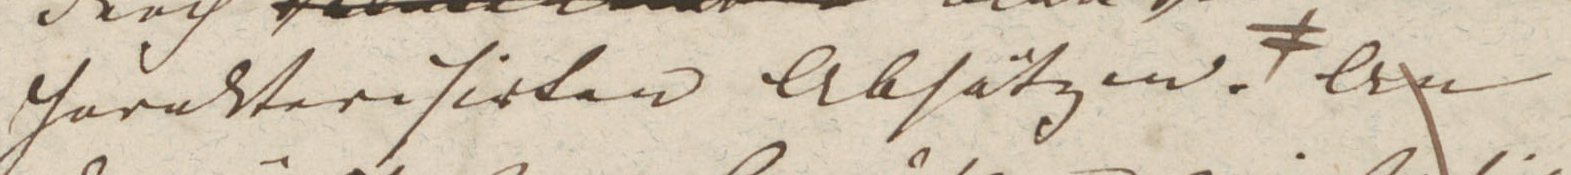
charakterisirten Absätzen.% An
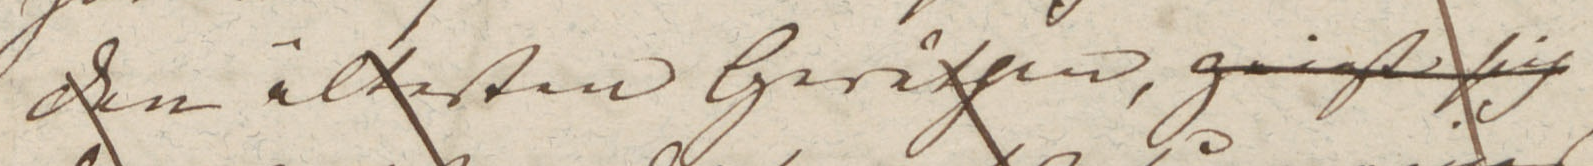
den ältesten Geräthen, zeigt sich
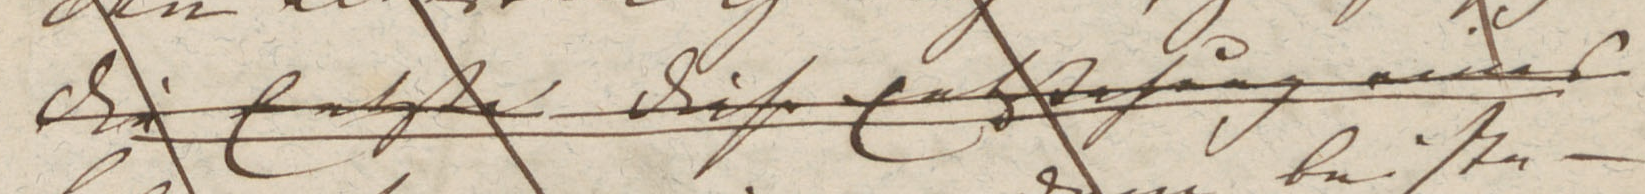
die Entste diese Entstehung eines
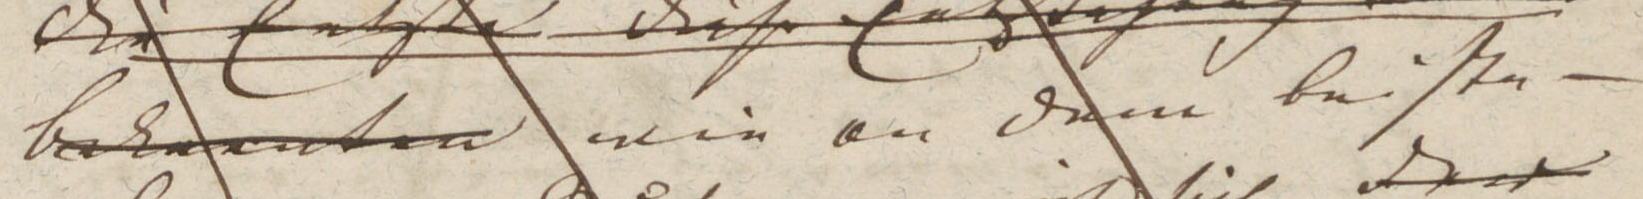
bekannten wie an dem beiste-
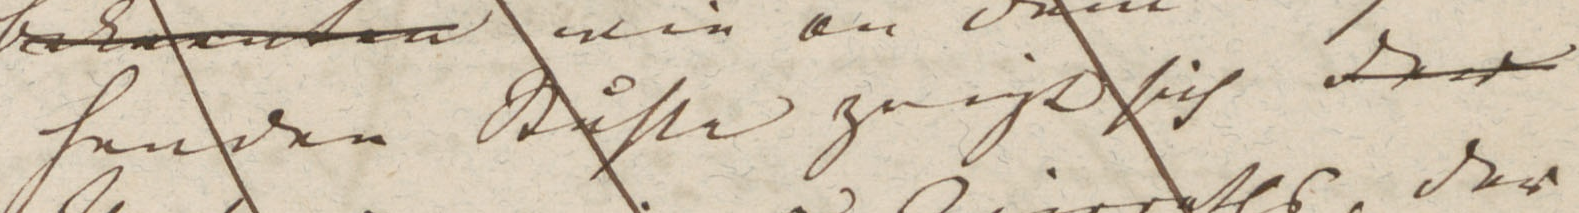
henden Stuhle zeigt sich der
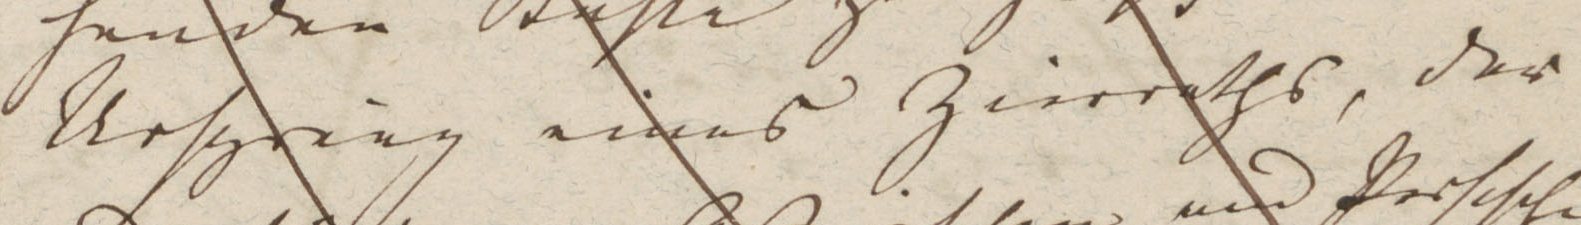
Ursprung eines Zierraths, der
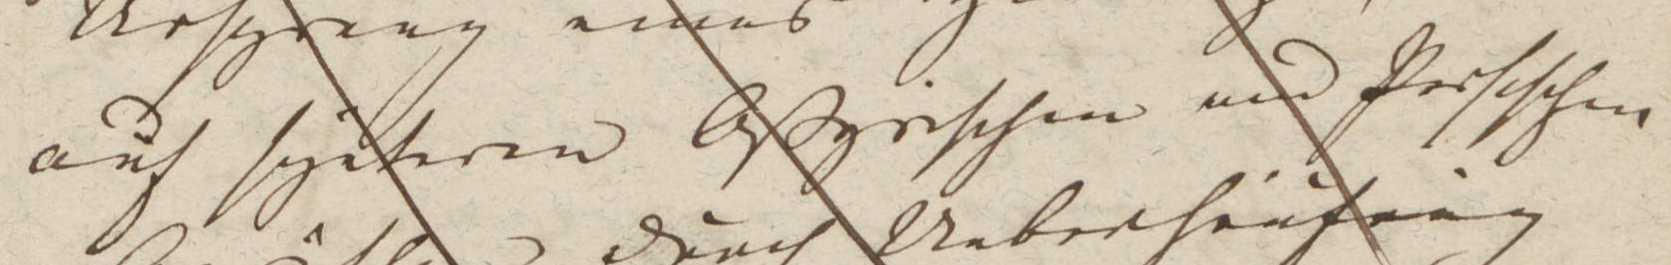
auf späteren Assyrischen und Persischen
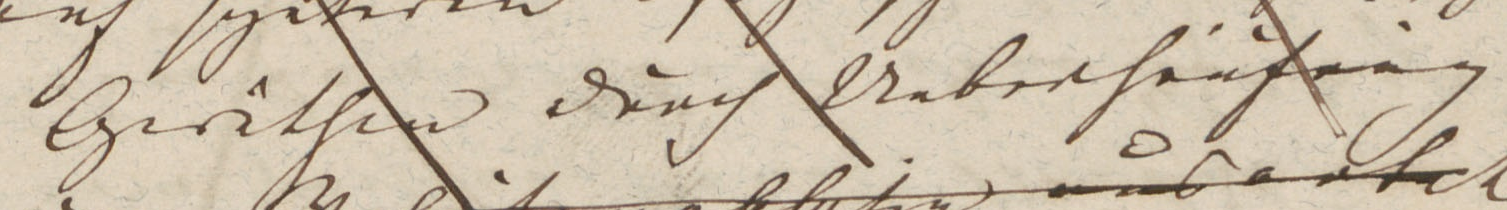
Geräthen durch Ueberhäufung
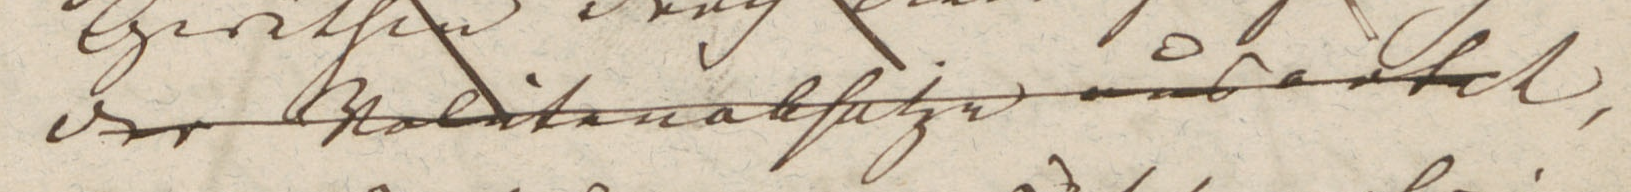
der Volutenabsätze ausartet,
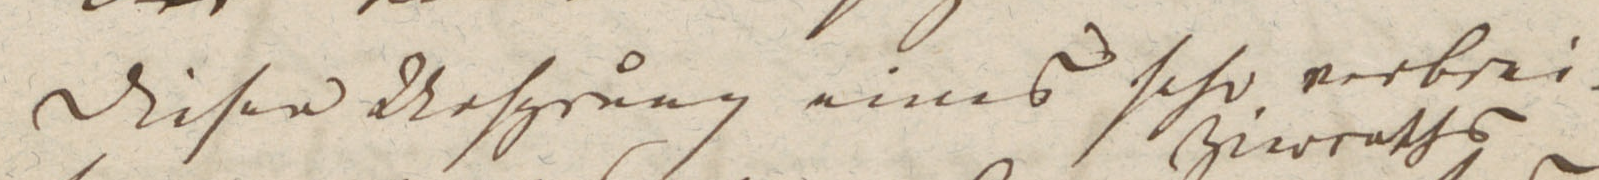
Dieser Ursprung eines sehr verbrei-
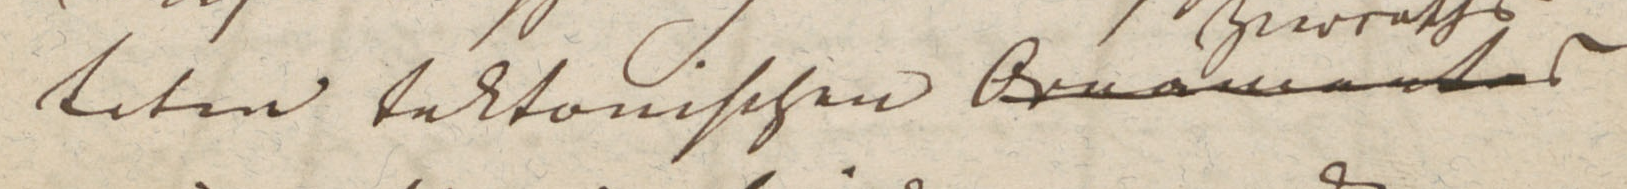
teten tektonischen Ornamentes
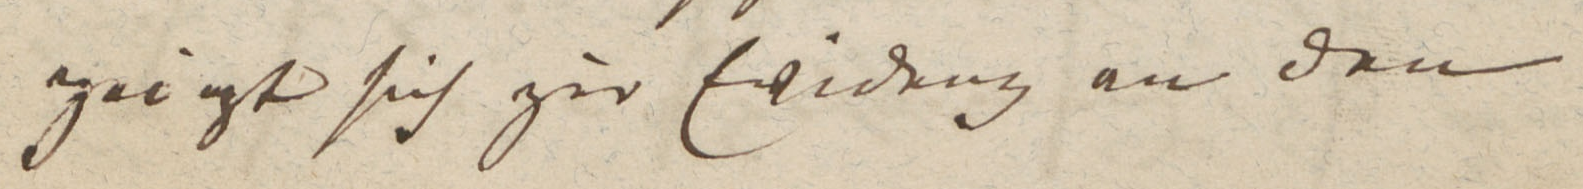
zeigt sich zur Evidenz an den
